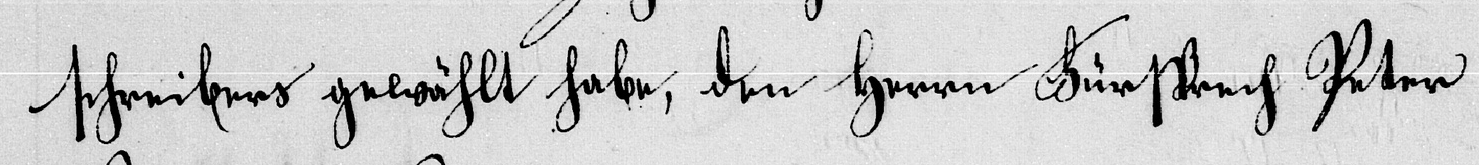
schreibers gewählt habe, den Herrn Fürsprech Peter
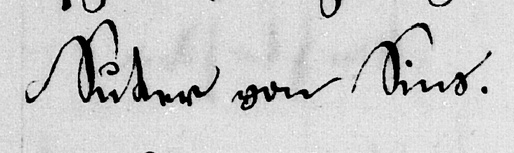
Suter von Sins.
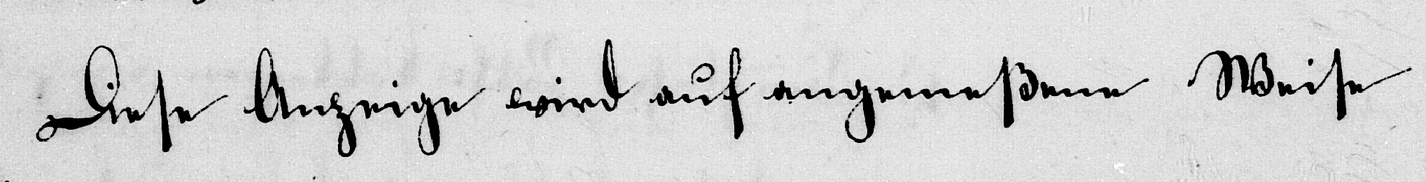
Diese Anzeige wird auf angemeßene Weise
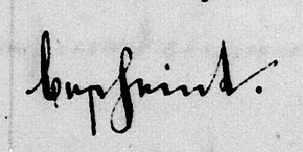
bescheint.
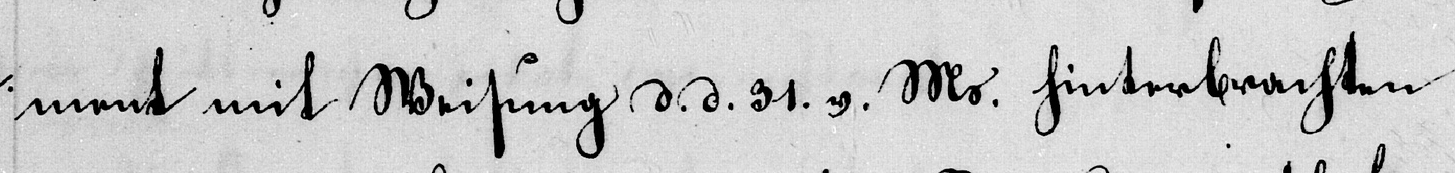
ment mit Weisung d. d. 31. v. Ms. hinterbrachten
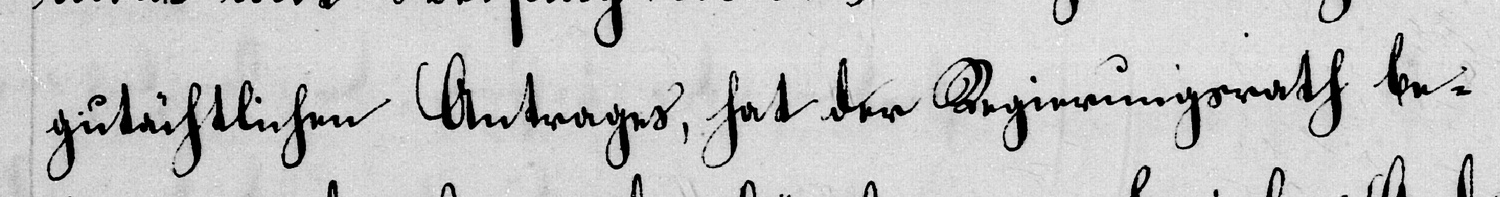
gutächtlichen Antrages, hat der Regierungsrath be¬
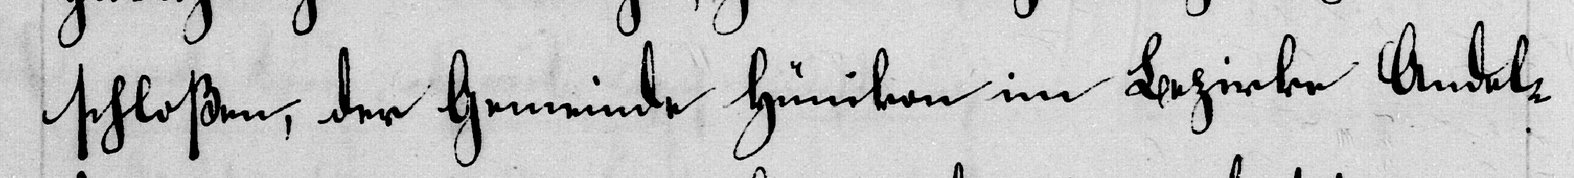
schloßen, der Gemeinde Hünikon im Bezirke Andel¬
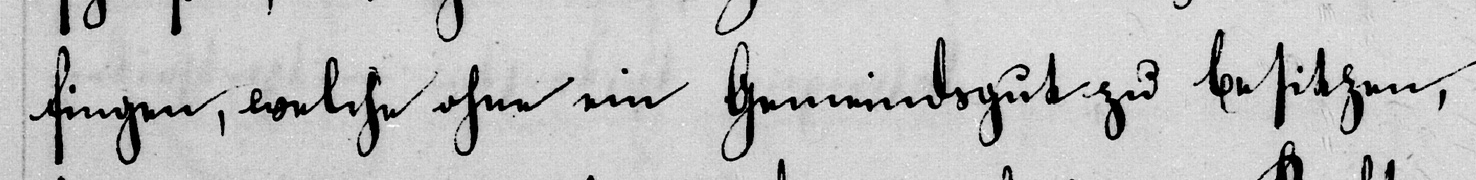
fingen, welche ohne ein Gemeindsgut zu besitzen,
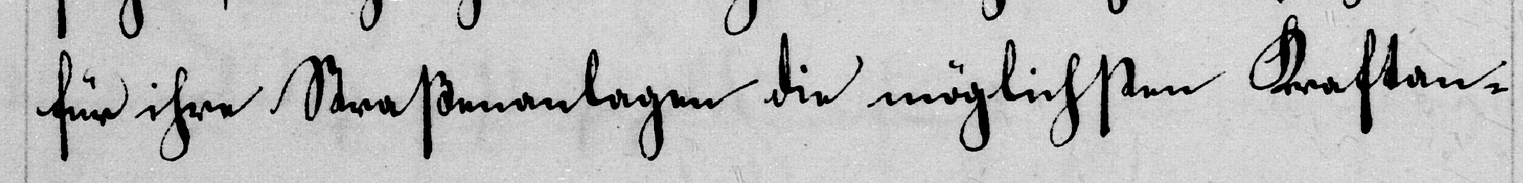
für ihre Straßenanlagen die möglichsten Kraftan-
